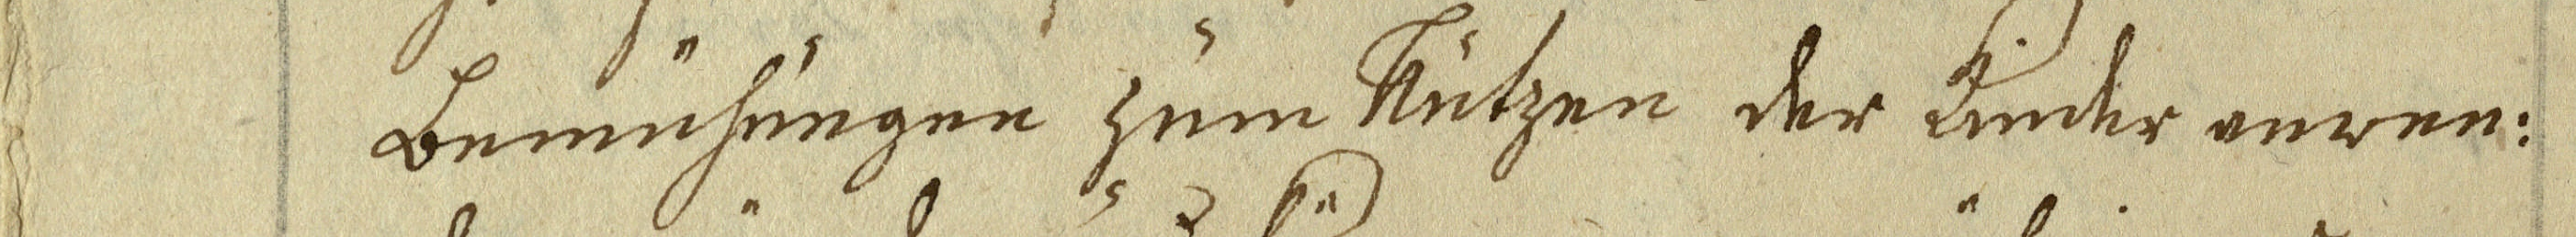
Bemühungen zum Nutzen der Kinder anwen¬
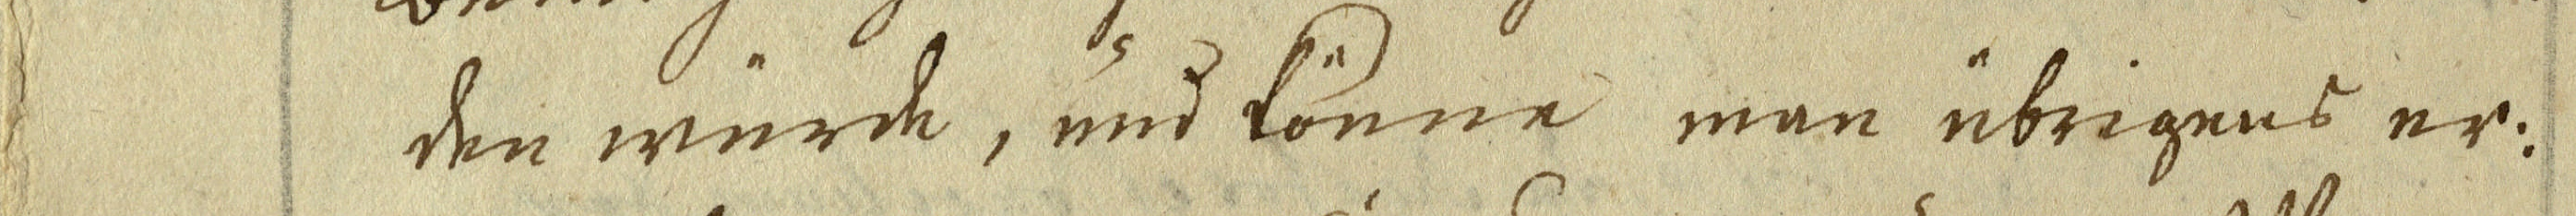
den würde, und könne man übrigens er¬
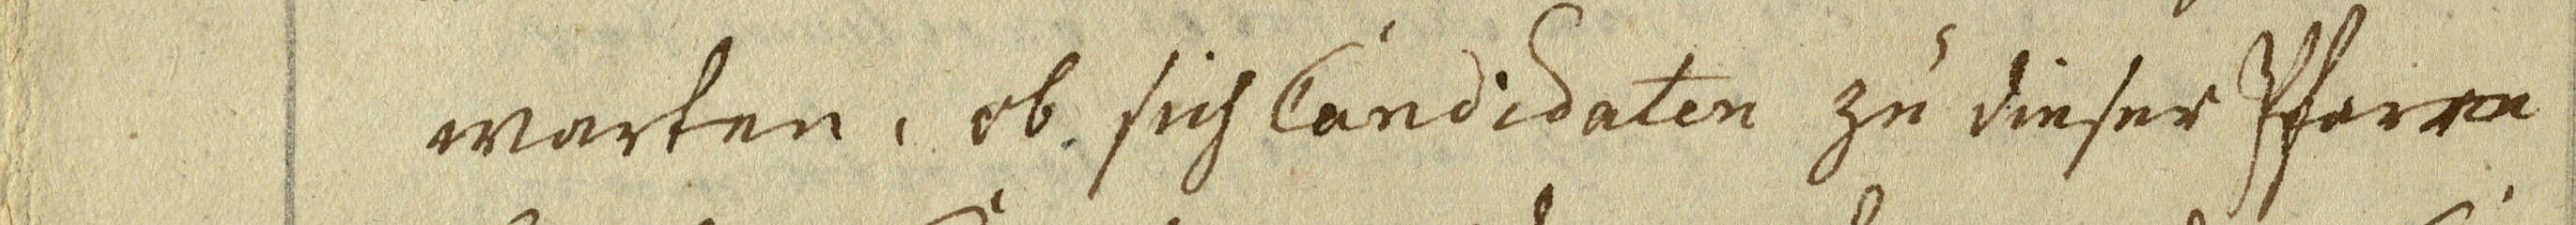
warten, ob sich Candidaten zu dieser Pfarre
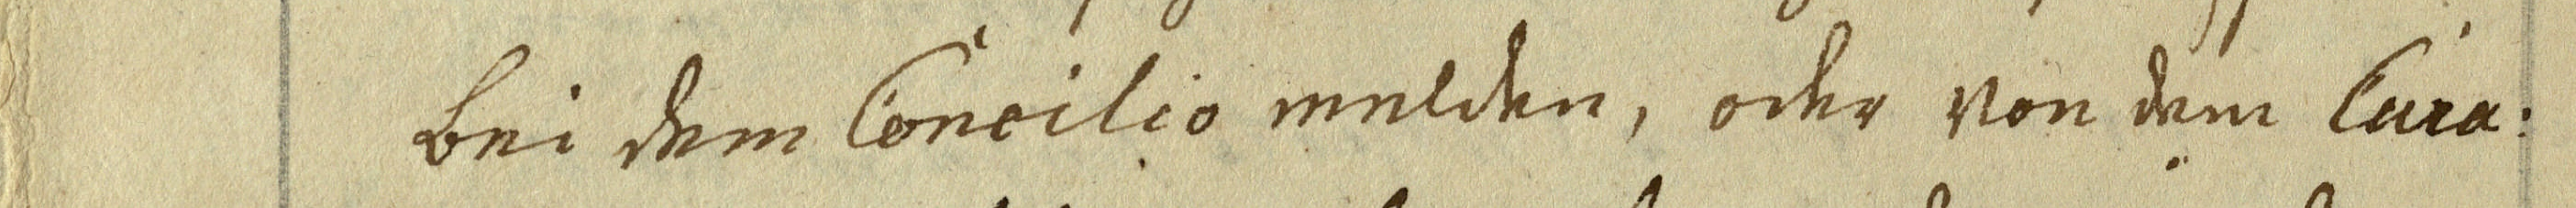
bei dem Concilio melden, oder von dem Cura¬
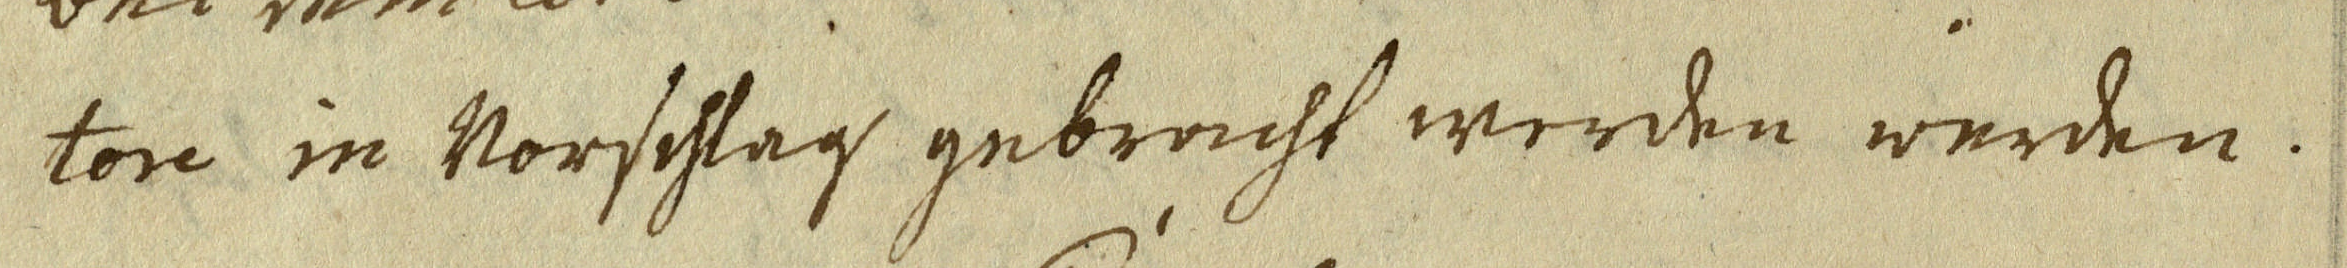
tore in Vorschlag gebracht werden würden.
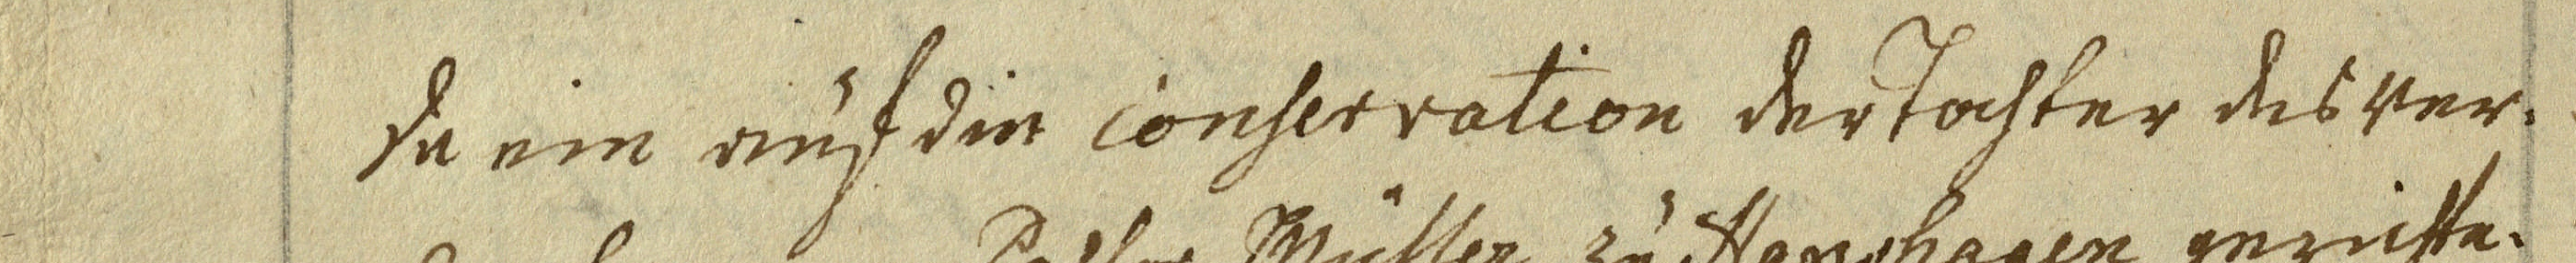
Da ein auf die Conservation der Tochter des ver¬
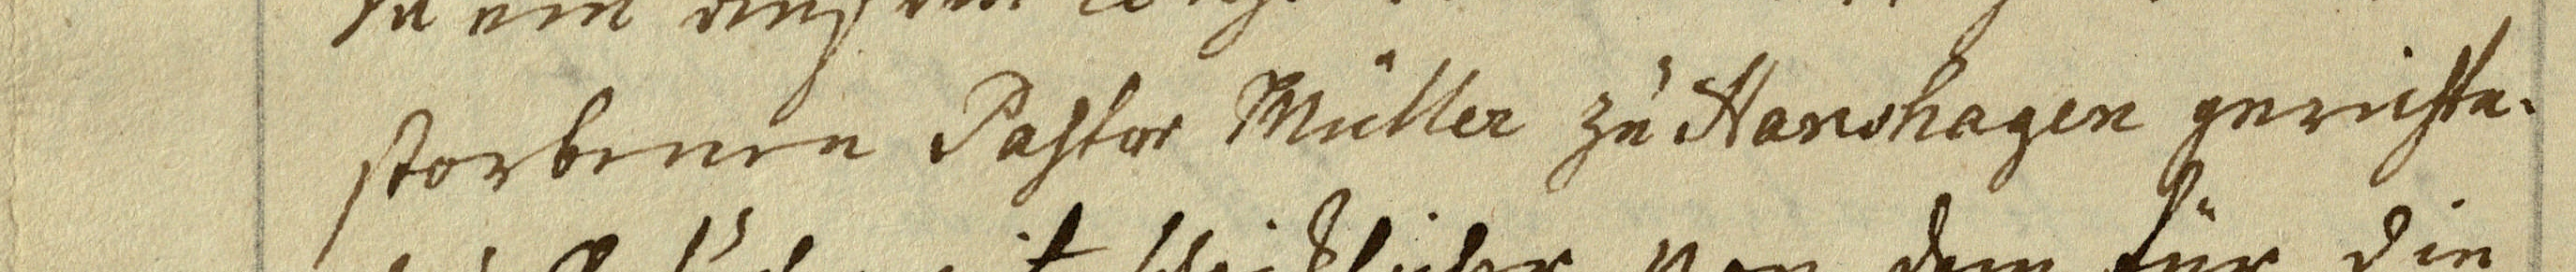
storbenen Pastor Müller zu Hanshagen gerichte¬
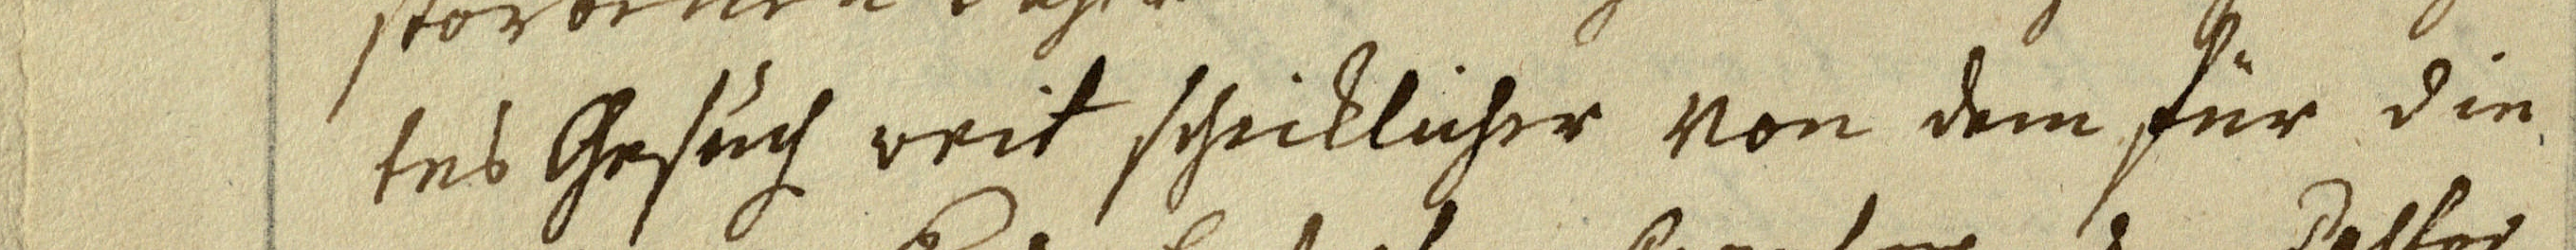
tes Gesuch weit schicklicher von dem für die
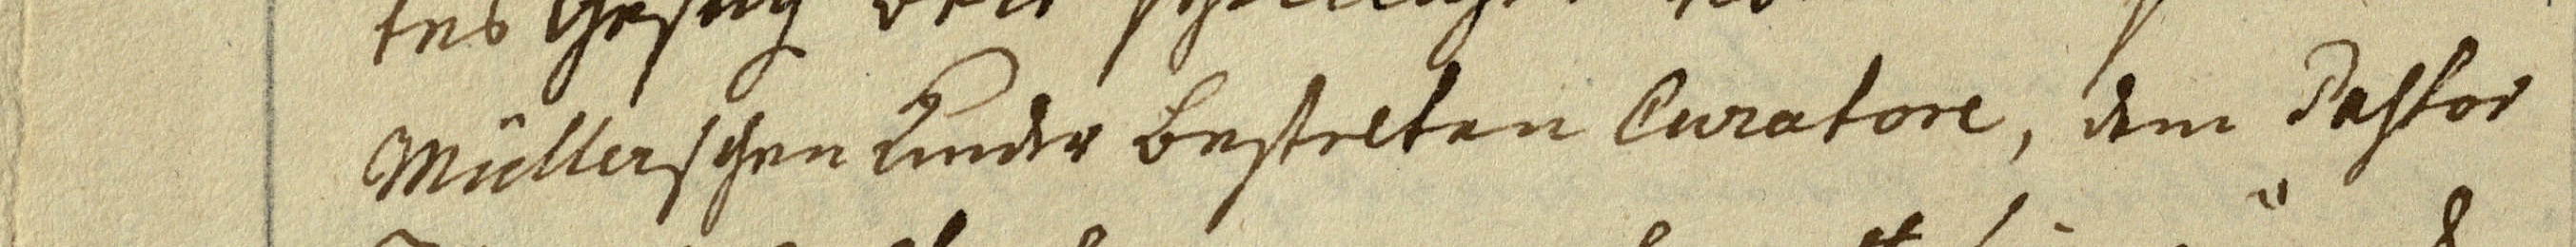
Müllerschen Kinder bestelten Curatore, dem Pastor
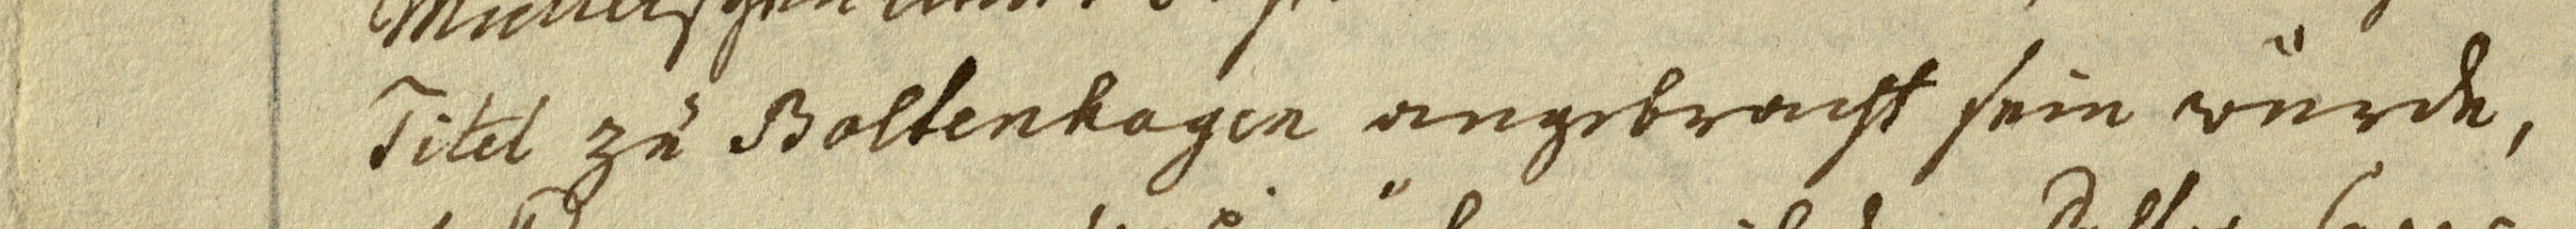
Titel zu Boltenhagen angebracht sein würde,
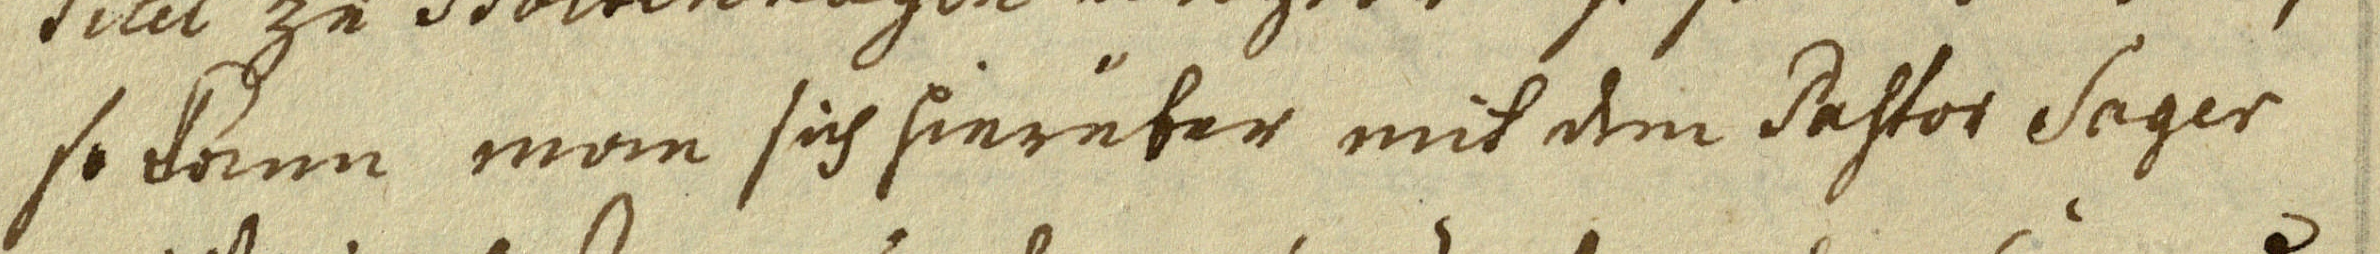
so kann man sich hierüber mit dem Pastor Sager
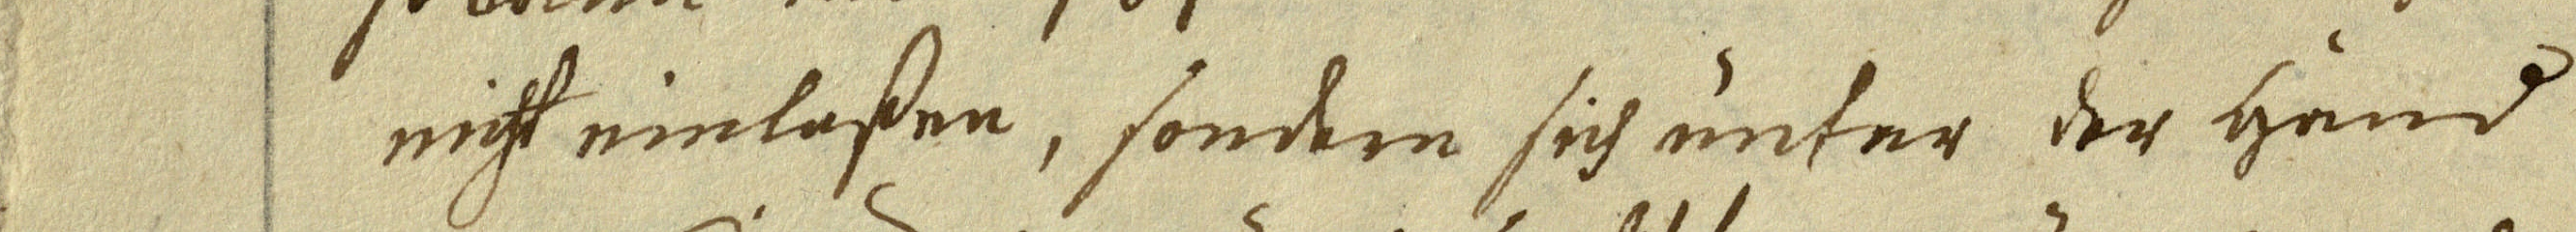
nicht einlaßen, sondern sich unter der Hand
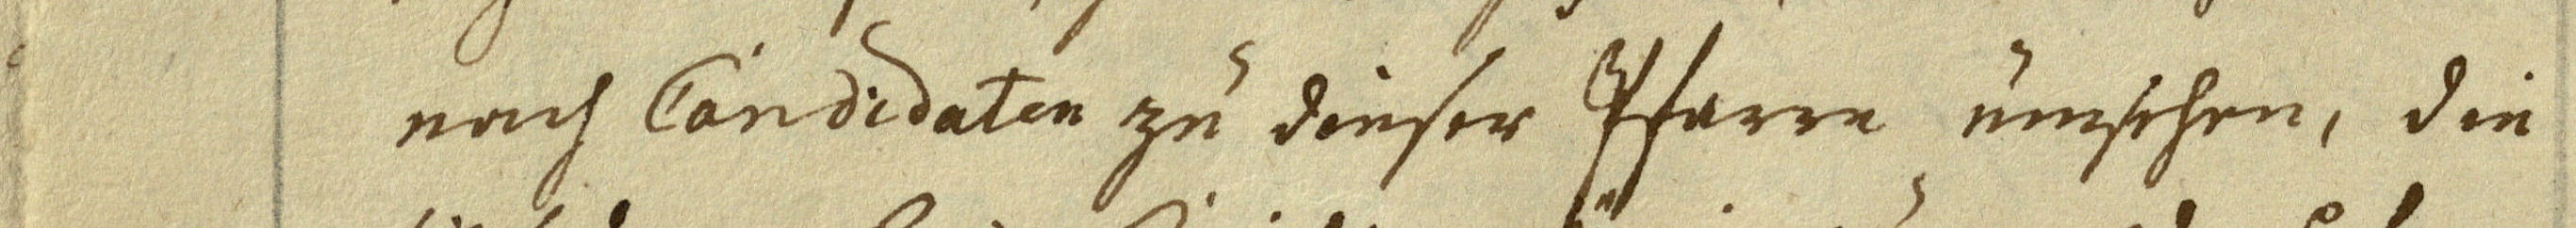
nach Candidaten zu dieser Pfarre umsehen, die
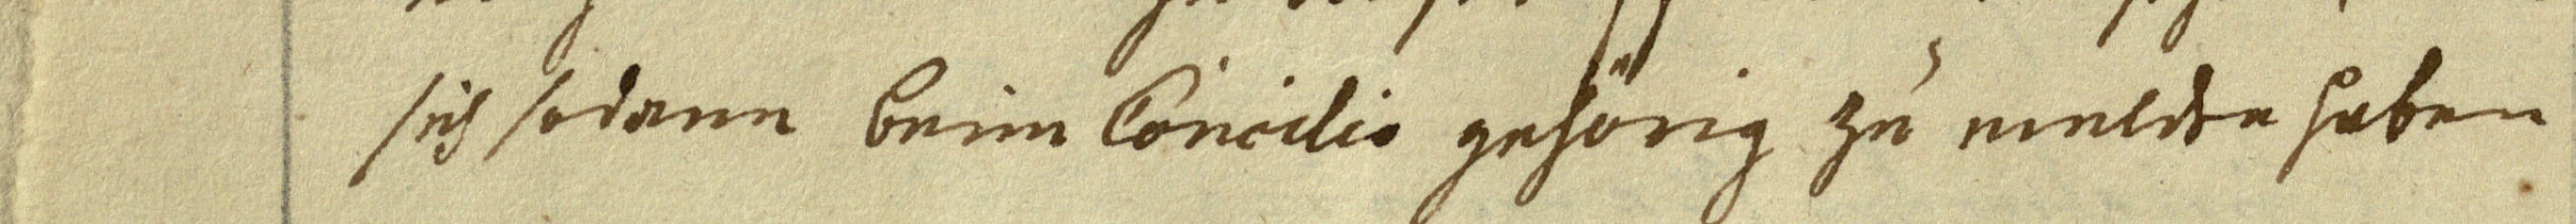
sich sodann beim Concilio gehörig zu melden haben.
